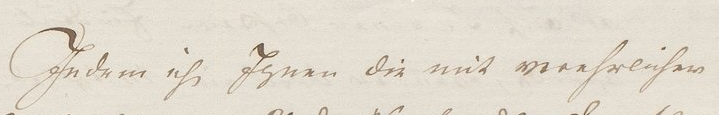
Indem ich Ihnen die mit verehrlicher
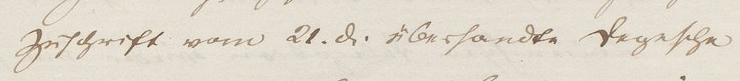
Zuschrift vom 21. d. übersandte Depesche
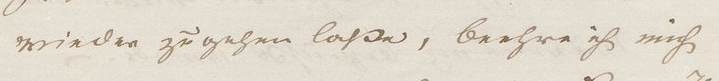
wieder zugehen laßen, beehre ich mich
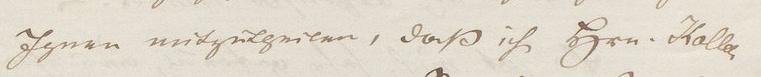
Ihnen mitzutheilen, daß ich Hrn. Koller
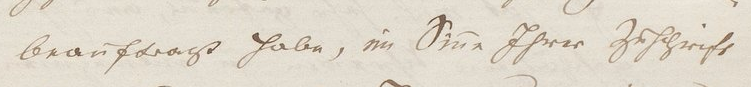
beauftragt habe, im Sinne Ihrer Zuschrift
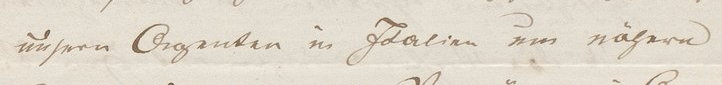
unsern Agenten in Italien um nähern
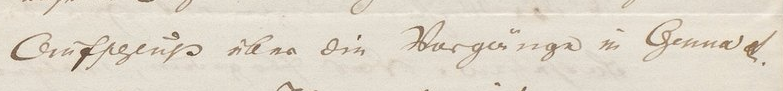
Aufschluß über die Vorgänge in Genua etc.
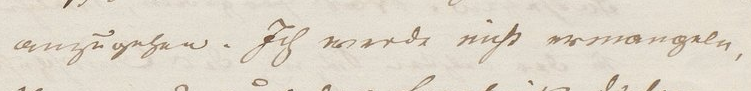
anzugehen. Ich werde nicht ermangeln,
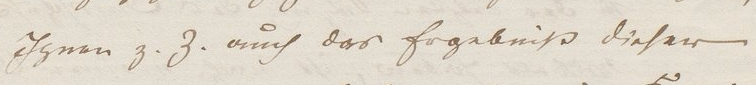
Ihnen z. Z. auch das Ergebniß dieser
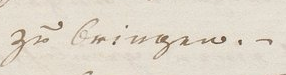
zu bringen. –
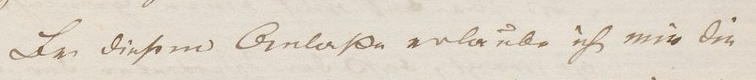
Bei diesem Anlaße erlaube ich mir die
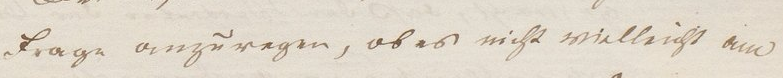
Frage anzuregen, ob es nicht vielleicht am
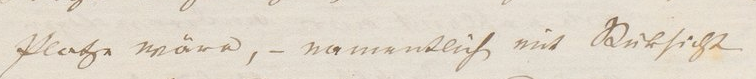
Platze wäre, – namentlich mit Rüksicht
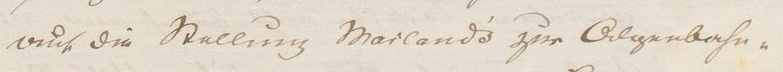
auf die Stellung Mailand's zur Alpenbahn-
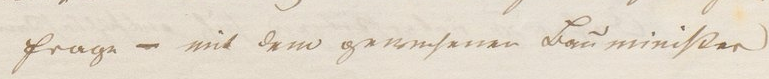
frage – mit dem gewesenen Bauminister
